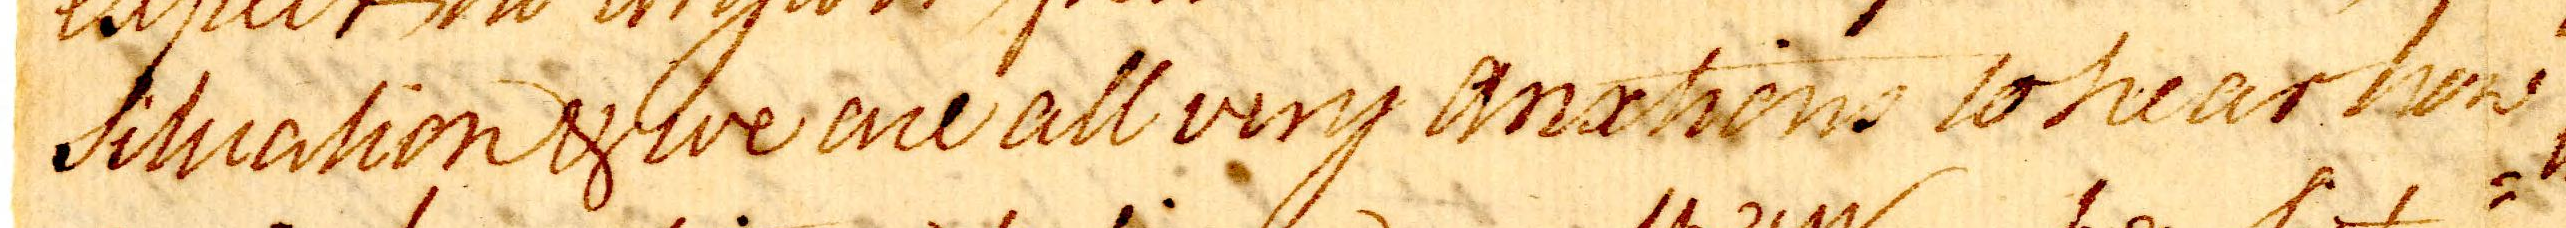Situation & we are all very Anxious to hear how
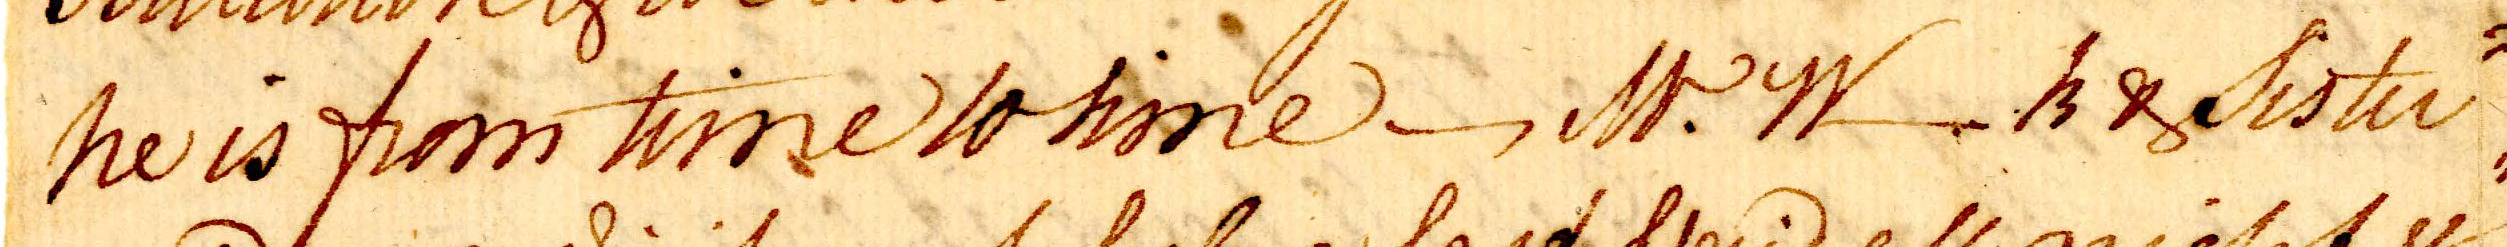he is from time to time. M^r. W- B & Sister
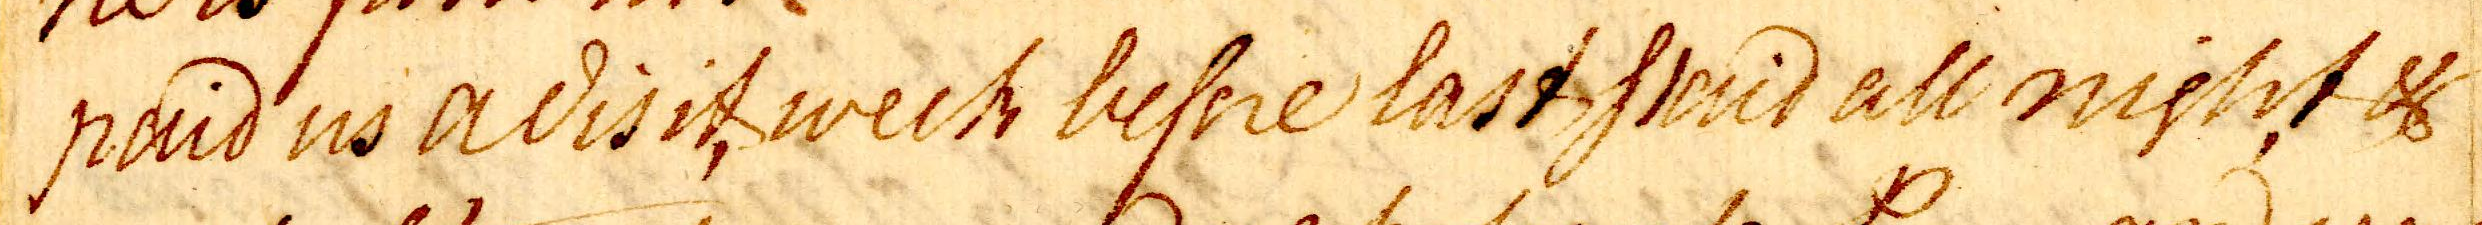paid us a visit, week before last staid all night &
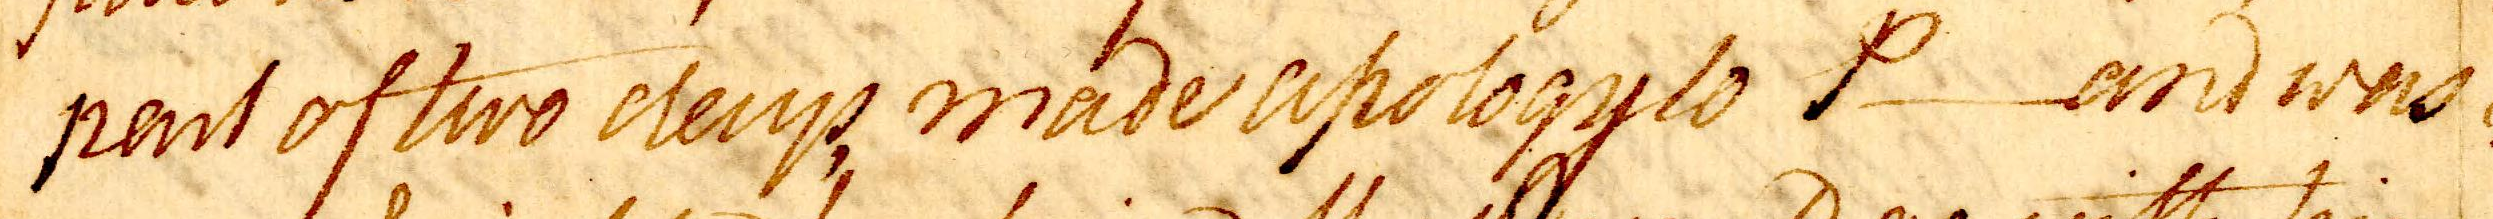part of two days, made apology to P– and was
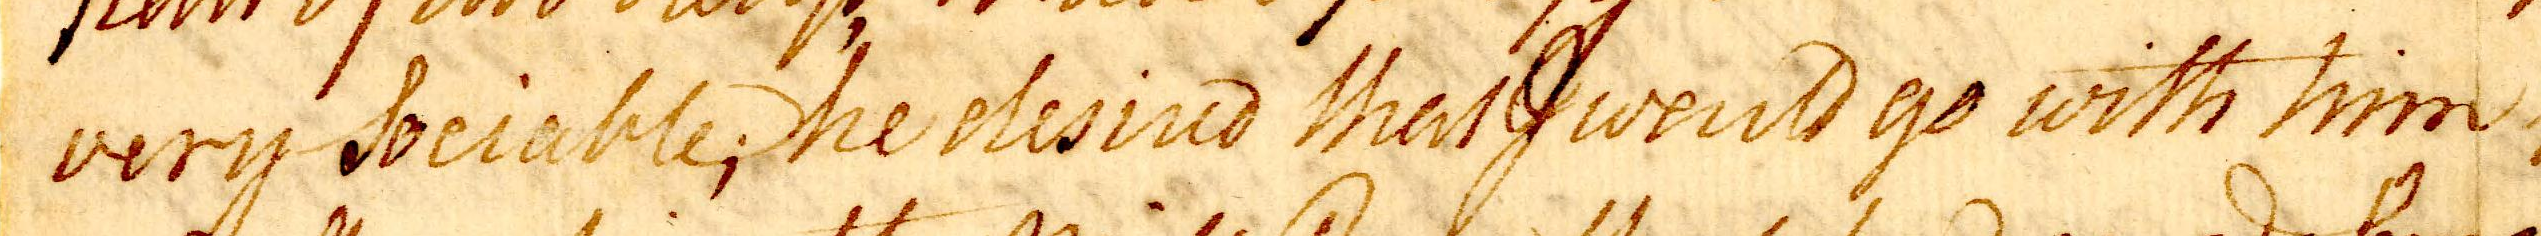very sociable, he desired that I would go with him
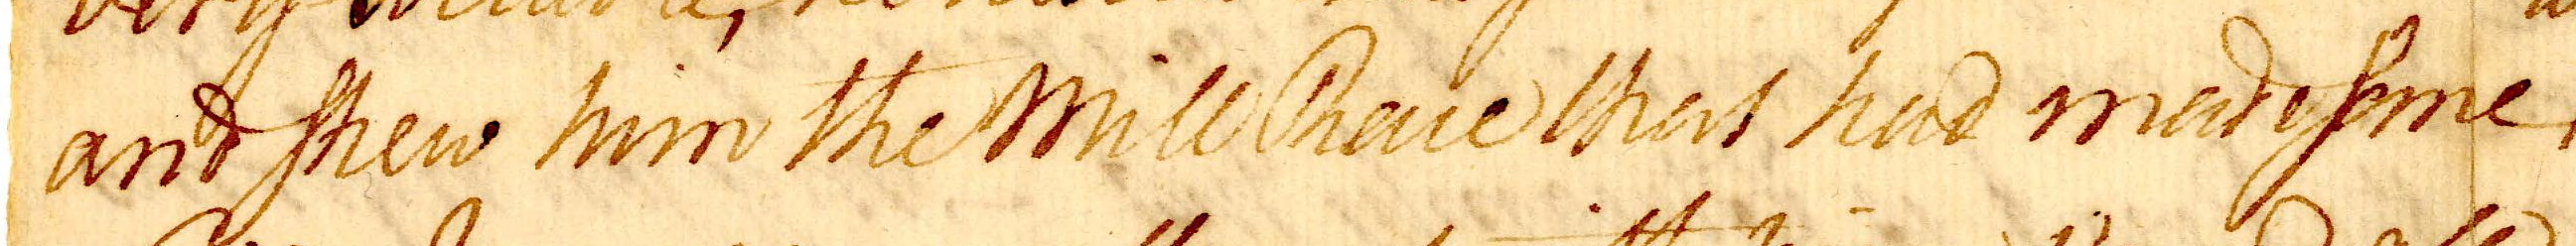and shew him the Mill Race that had made some
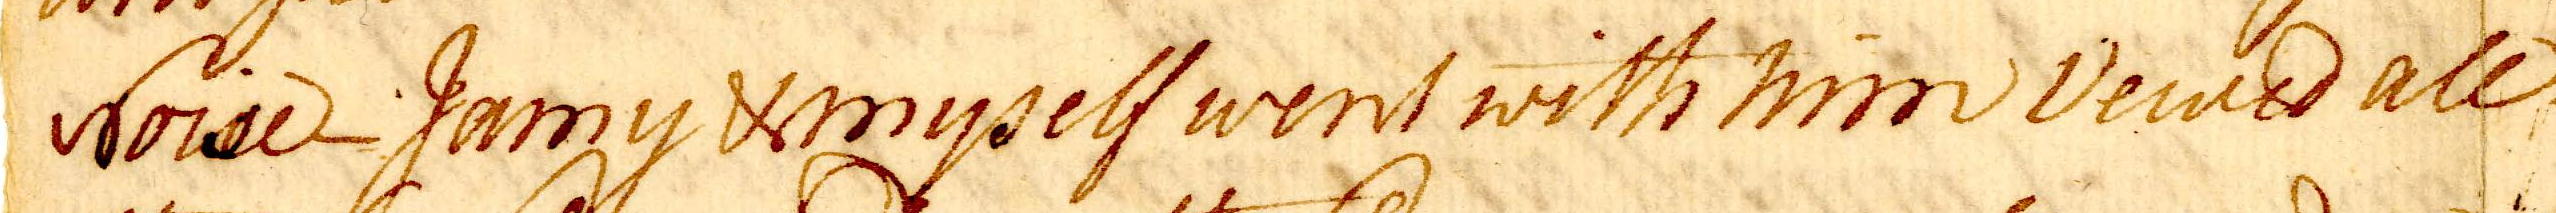Noise. Jamy & myself went with him Vewed all
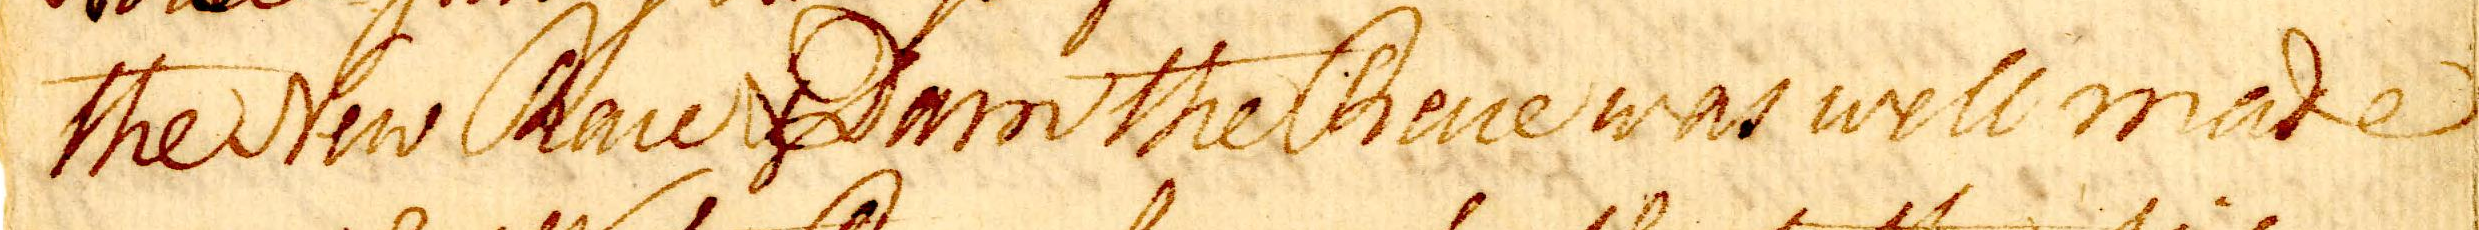the New Race & Dam the Race was well made
